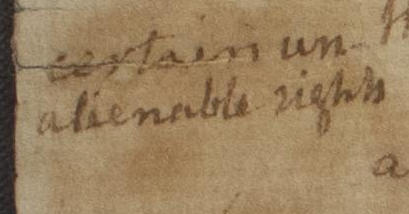-alienable rights
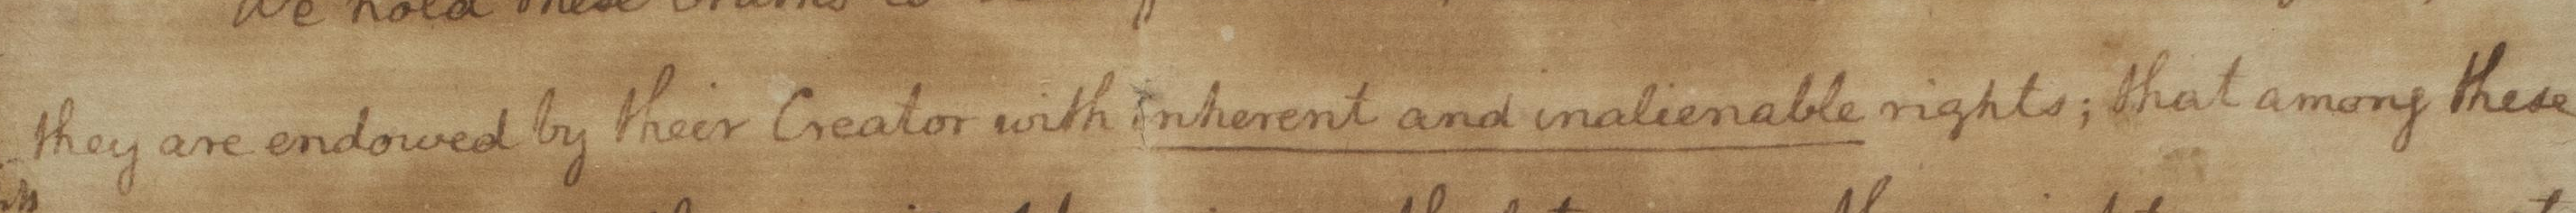they are endowed by their Creator with inherent and inalienable rights; that among these
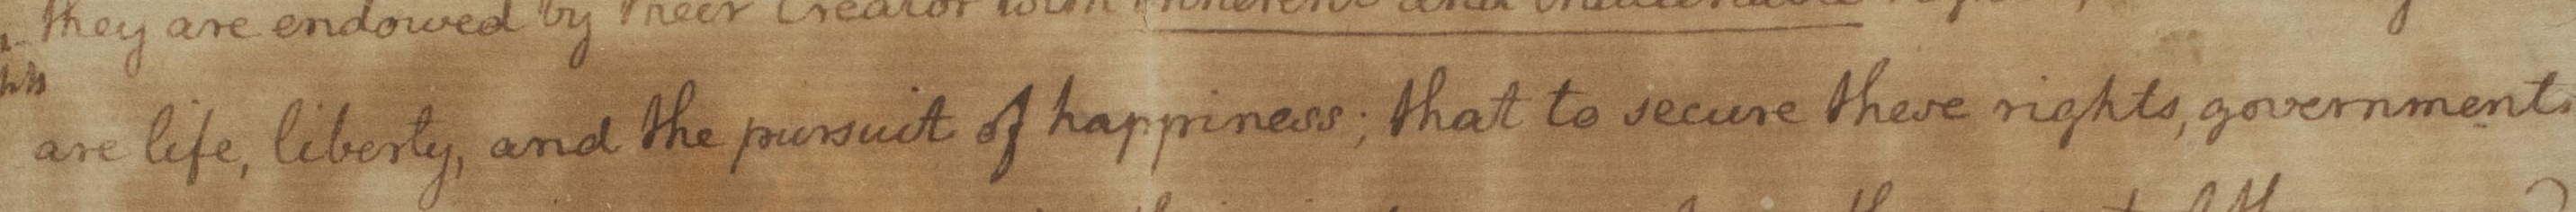are life, liberty and the pursuit of happiness, that to secure these rights governments
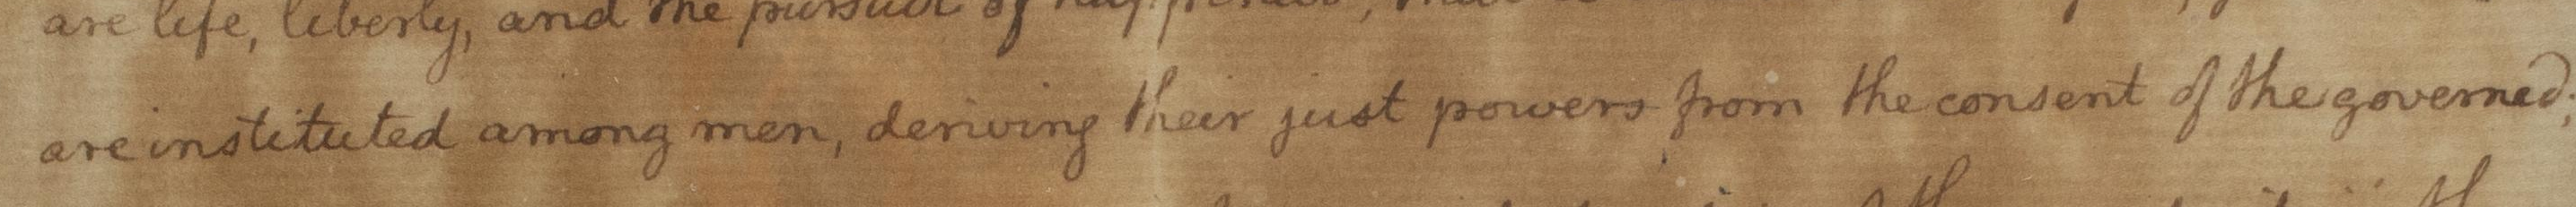are instituted among men, deriving their just powers from the consent of the governed;
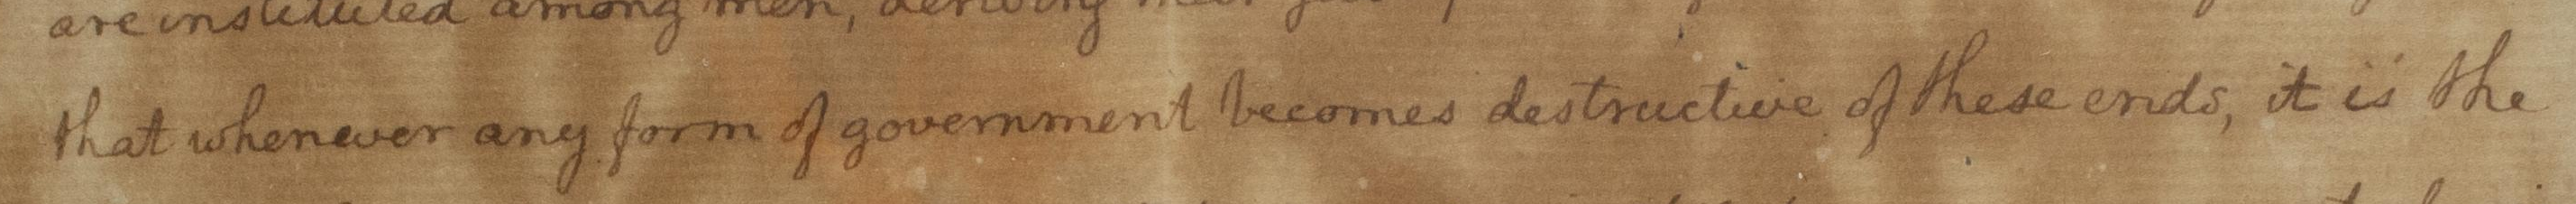that whenever any form of government becomes destructive of these ends, it is the
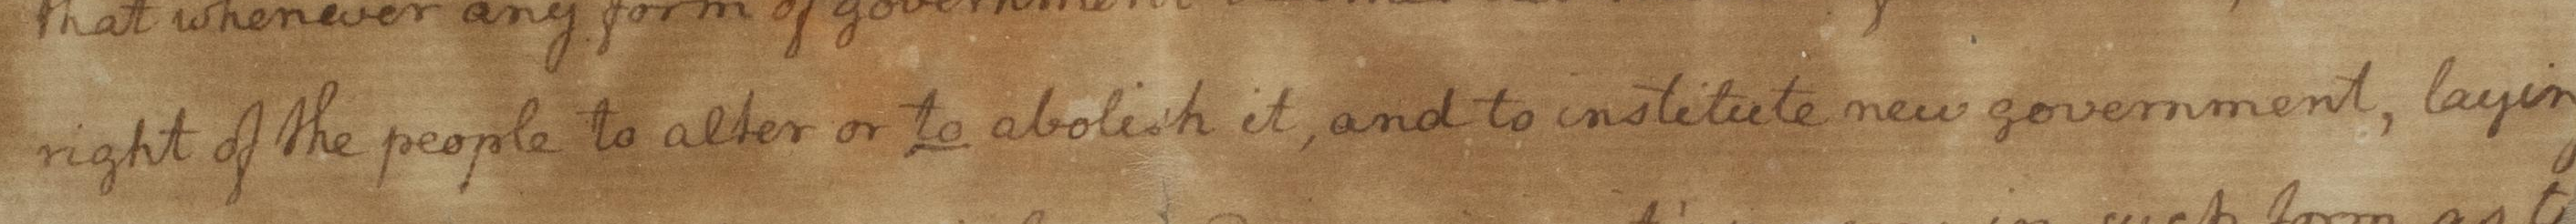right of the people to alter or to abolish it, and to institute new government, laying
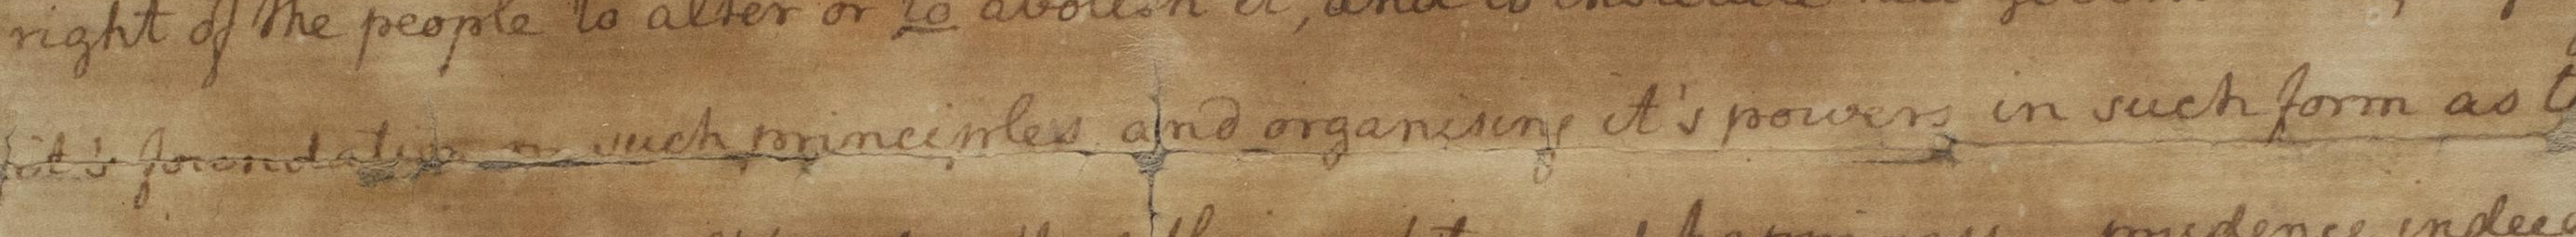it's foundation on such principles and organizing it's power in such form as to
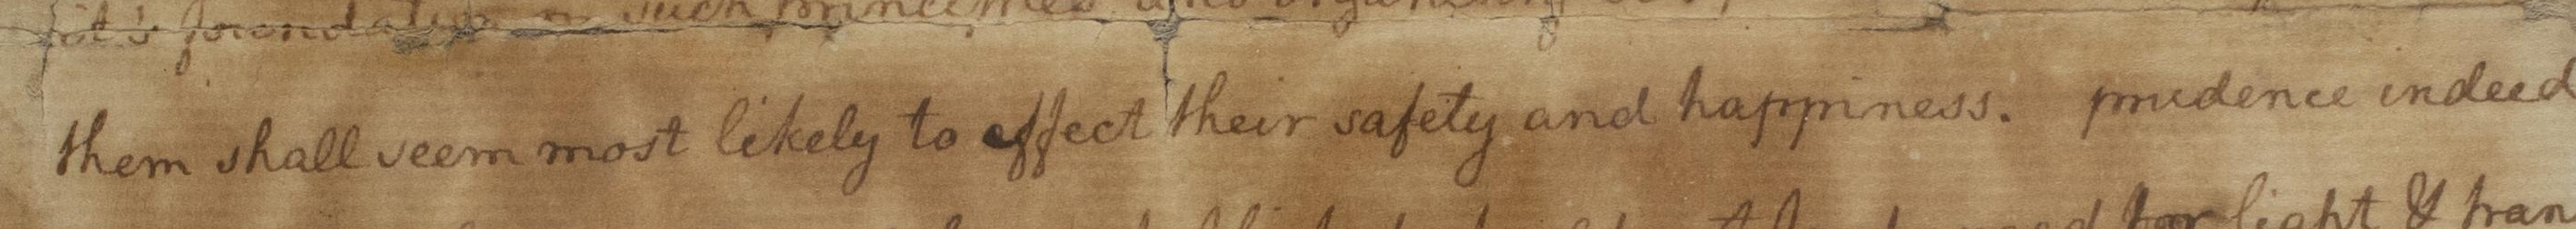them shall seem most likely to effect their safety and happiness. prudence indeed
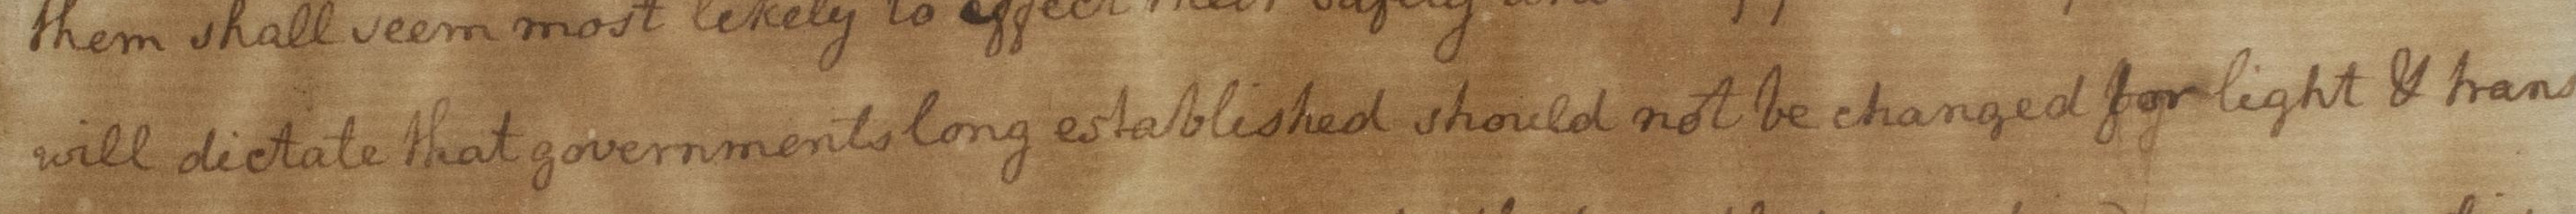will dictate that governments long established should not be changed for light & trans-
